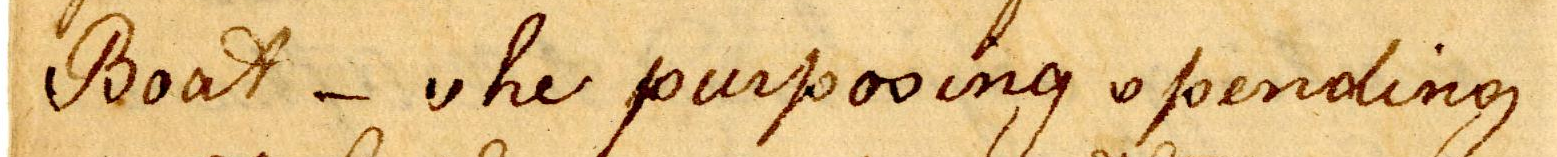Boat- she purposing spending
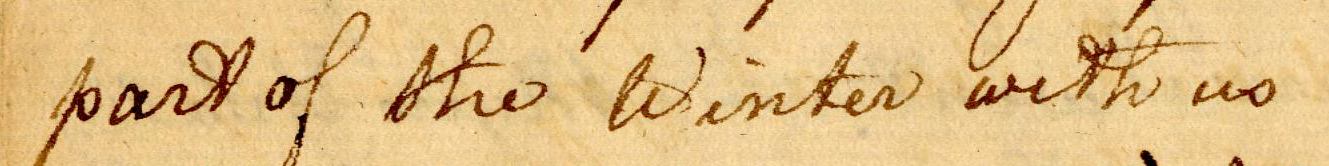part of the Winter with us
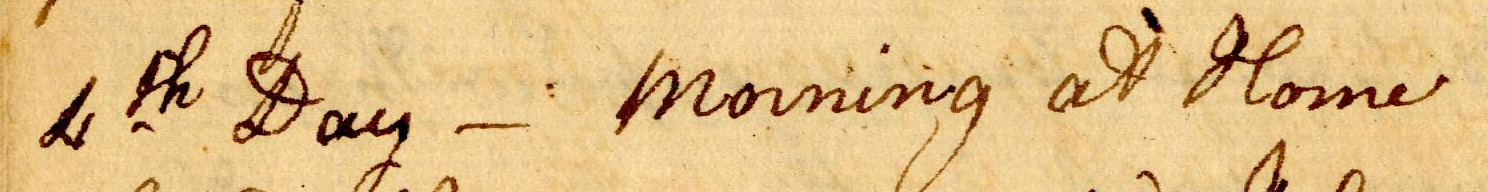4^th Day- Morning at Home
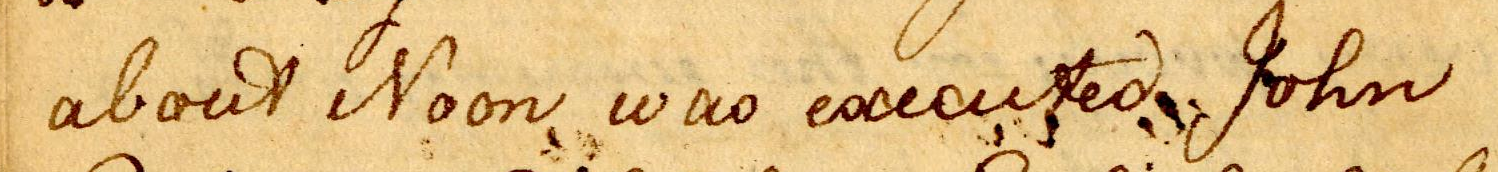about Noon was executed. John
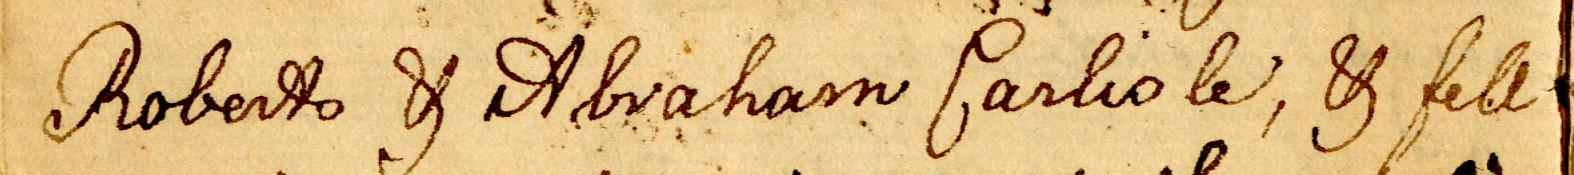Roberts & Abraham Carlisle, & fell
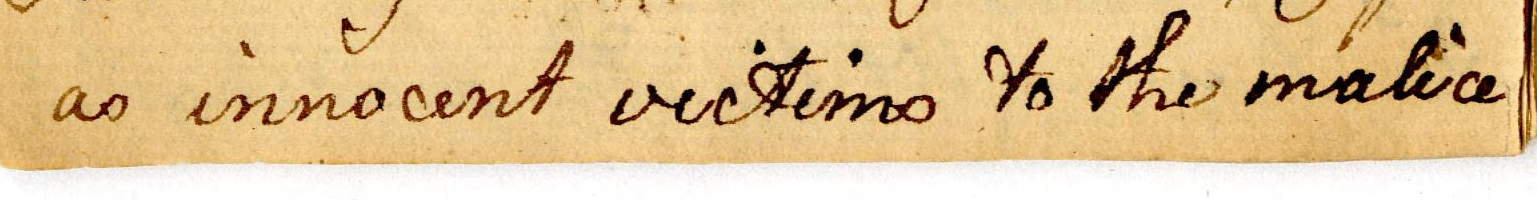as innocent victims to the malice
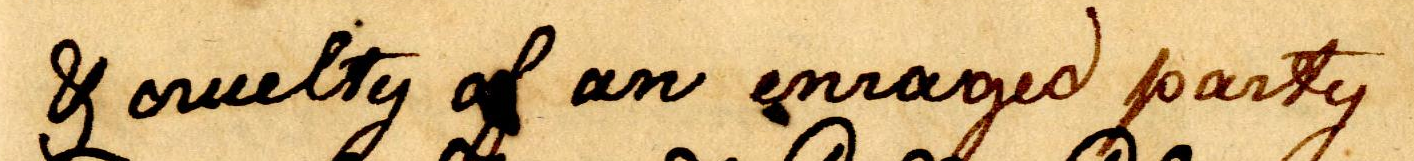& cruelty of an enraged party
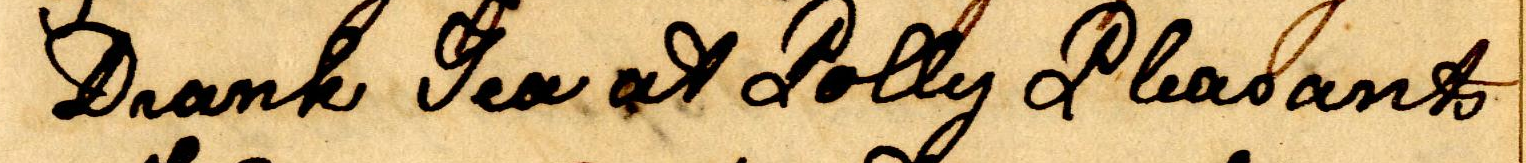Drank Tea at Polly Pleasants
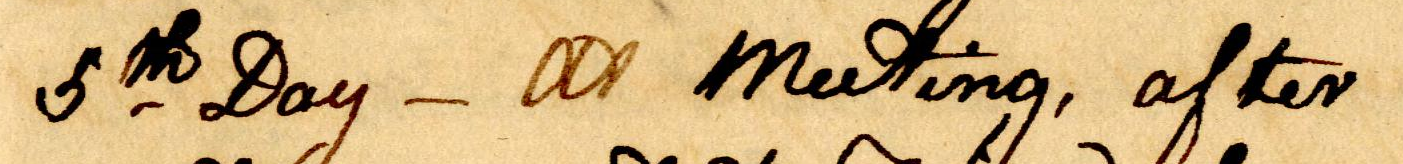5^th Day- At Meeting, after
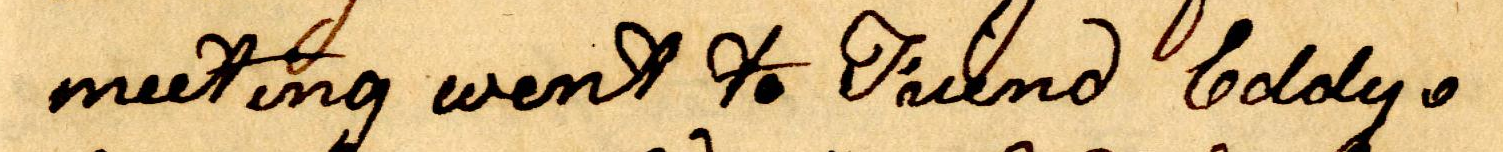meeting went to Friend Eddys
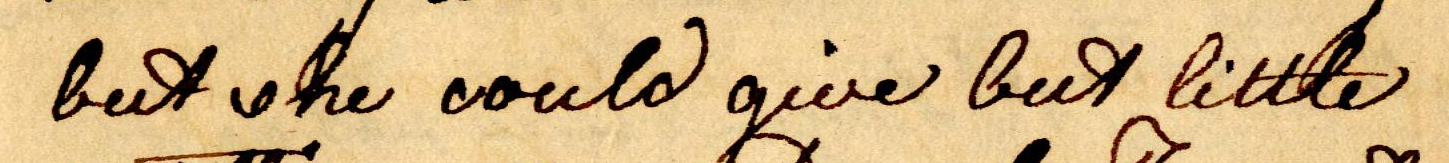but she could give but little
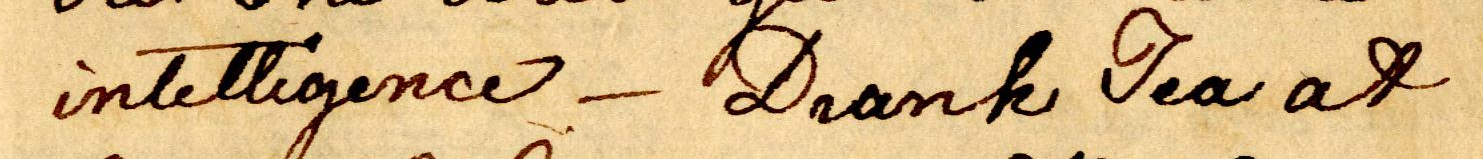intelligence- Drank Tea at
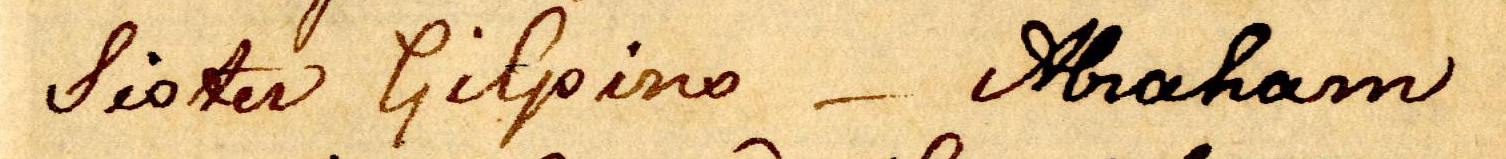Sister Gilpins- Abraham
